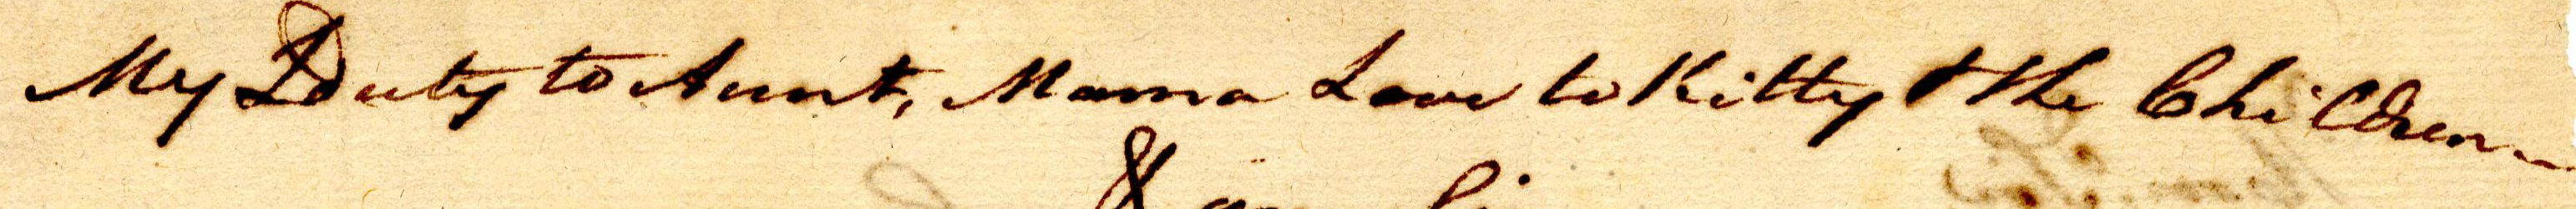My Duty to Aunt, Mama Love to Kitty & the Children-
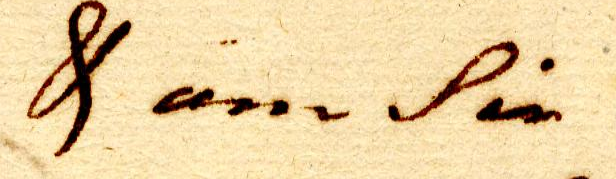& am Sir
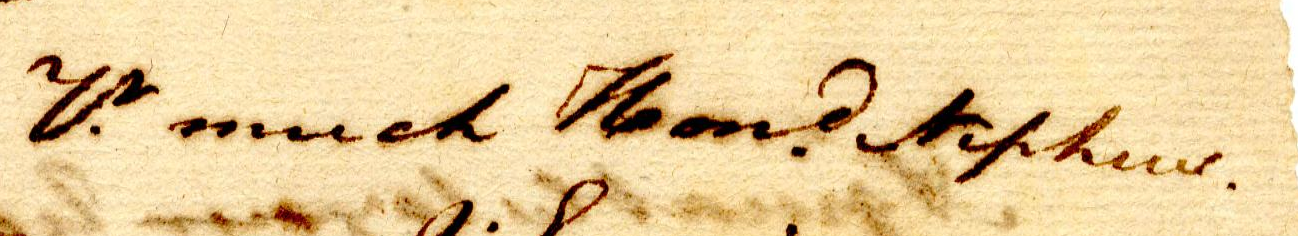Y^r. much Hond. Nephew.
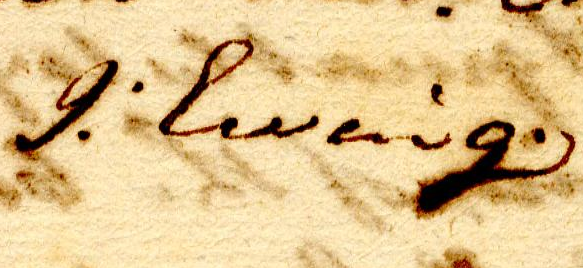J: Ewing.
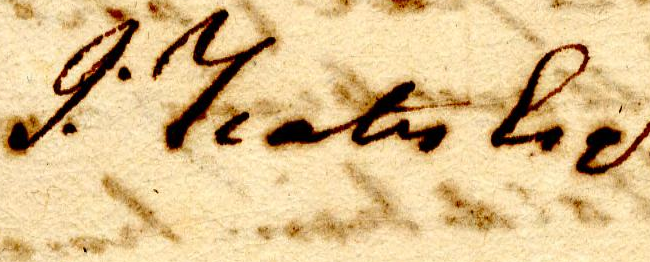J: Yeates Esq^r.-
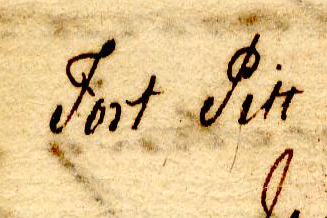Fort Pitt
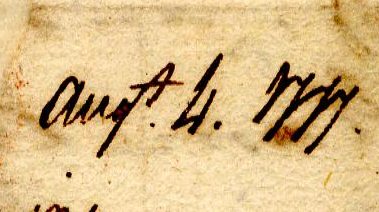Aug^t. 4. 1777.
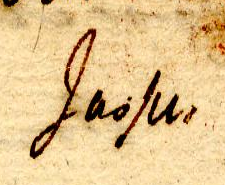Jasper
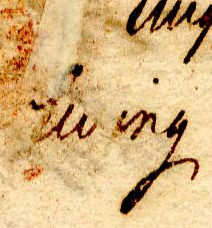Ewing
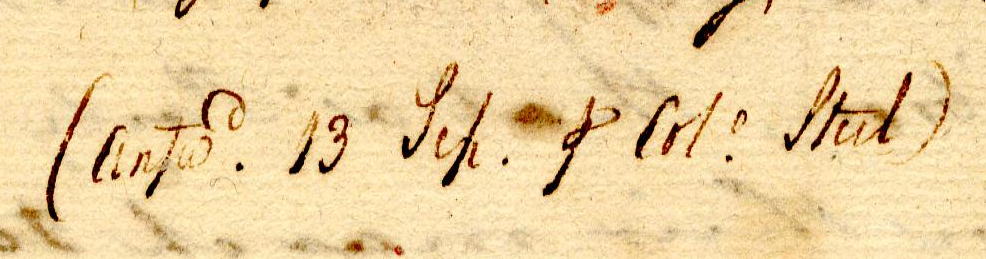(Answ^d 13 Sep. per Col^o Steel)
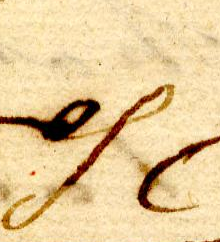To
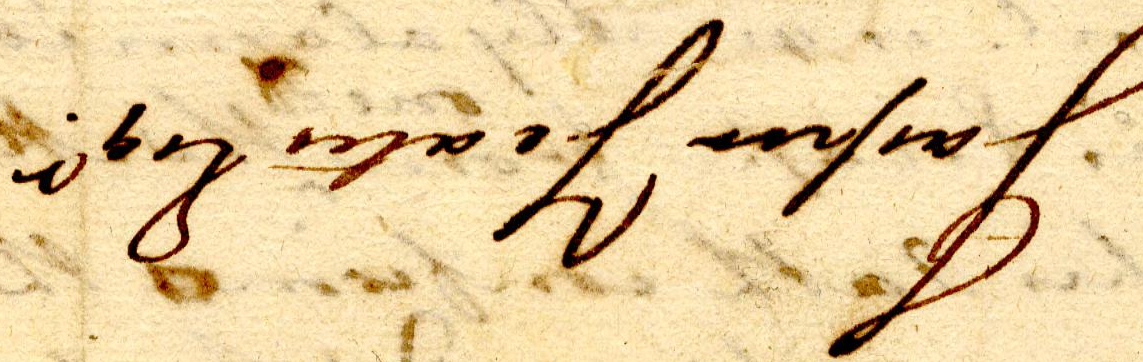Jasper Yeates Esq^r.
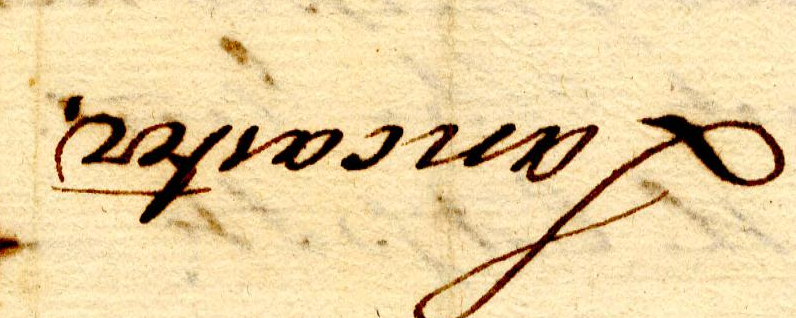Lancaster.
